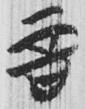言
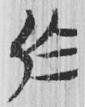於
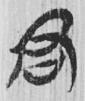君
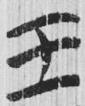王
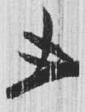之
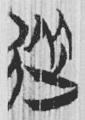從
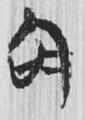含（今）
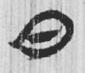日
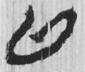㠯（以）
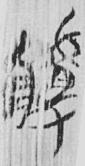○（瘥）
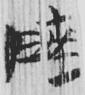陵
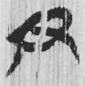尹
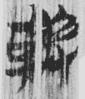與
